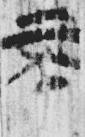不
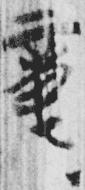章
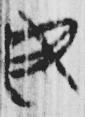母（毋）
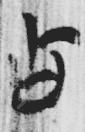占
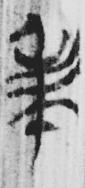民
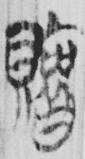○（斂）
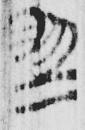則（則）
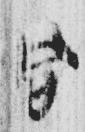同
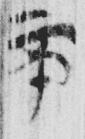不
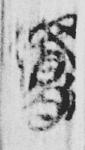膚
